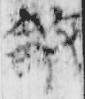○（令）
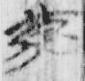黃
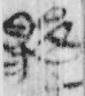○（燕）
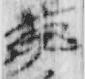黃
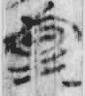倝
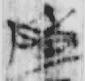○（陳）
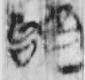欨
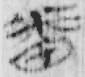番
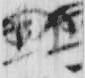班
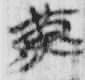黃
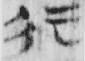行
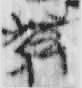登
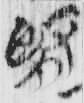○（賢）
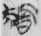○（胡）
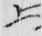上
